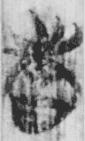○（味）
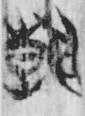朝
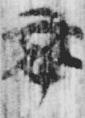不
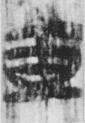車
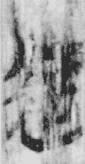逆
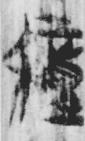穜
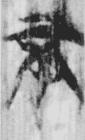不
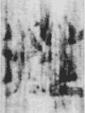毇
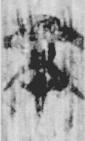不
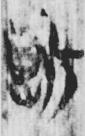折
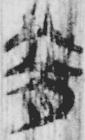骨
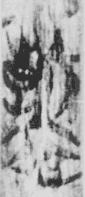裚（制）
